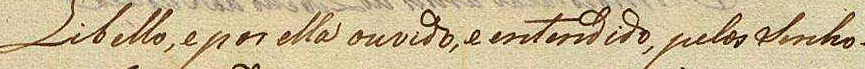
Libello, e por ella ouvido, e entendido, pelos Senho
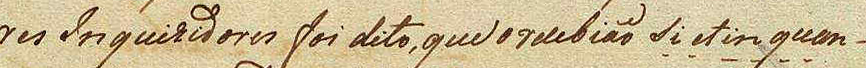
res Inquizidores foi dito, que o recebiaõ si et in quan
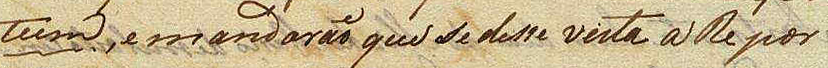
tum, e mandaraõ que se desse vista a Re por
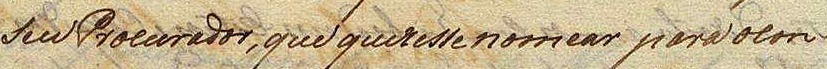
seu Procurador, que quizesse nomear para o con
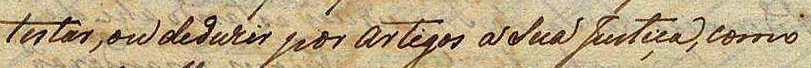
testar, ou deduzir por artigos a sua Justiça, como
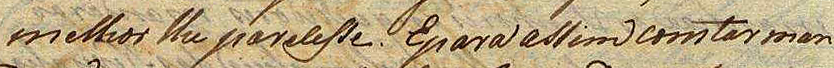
melhor lhe parecesse. E para assim constar man
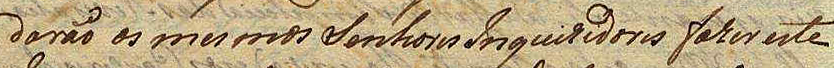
darão os mesmos Senhores Inquizidores fazer este
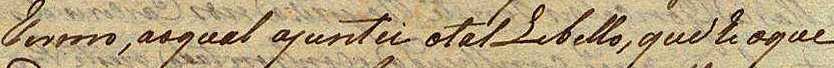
Termo, ao qual juntei o tal Libello, que he o que
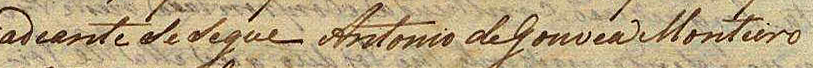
adiante se segue Antonio de Gouvea Monteiro
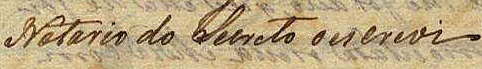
Notario do Secreto o escrevi
